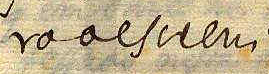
ro o escreui
